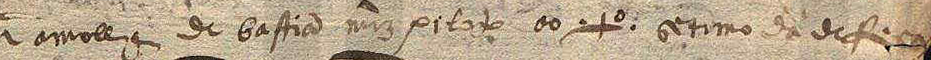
item a molher de bastiā mīz piloto ao .to. setimo da defesa
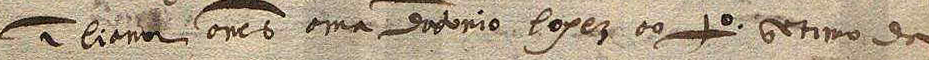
item lianor ānes ama d̄atonio lopez ao to. setimo da
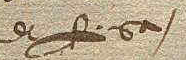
defesa /
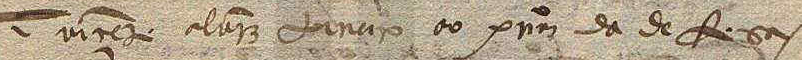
item uiç̄ente alūrz torneiro ao primo da defesa /
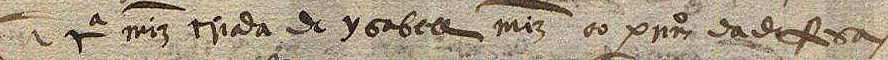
item ca m̄iz criada de ysabell m̄iz ao primo da defesa/
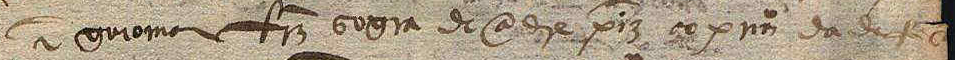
item guiomar fr̄z sogra de ādre p̄iz ao primo da defes
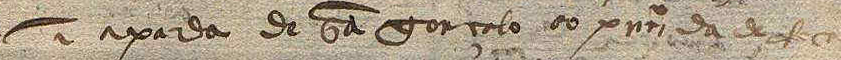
item a parda de s̄a gonçalo ao primo da defesa
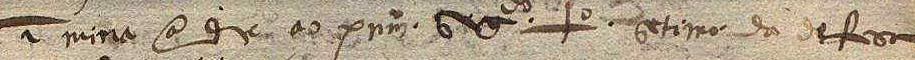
item miçia ādre ao primo. segdo. to. setimo. da defesa
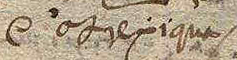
e a trepiqua /
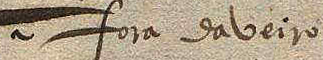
item fora daveiro
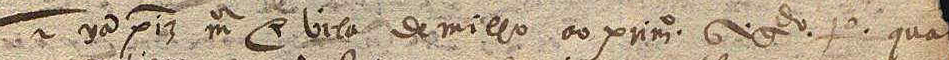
item yā p̄iz mor ē vila de milho ao primo. segdo. to. qua
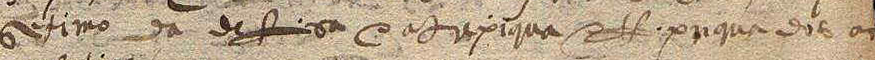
setimo da defesa e a trepiqua e Repriqua dos ac
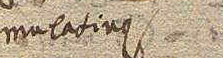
mulatiuꝯ /
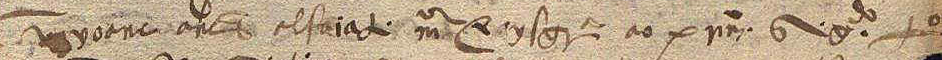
item yoane anes alfaiate mor ē a ysgra ao primo. segdo. to
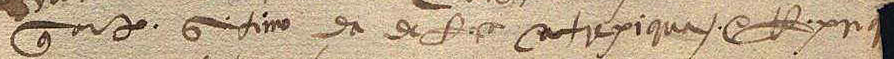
q̄arto. setimo da defesa e a trepiqua/. e Repriq
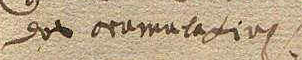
dos acumulatiuꝯ /.
